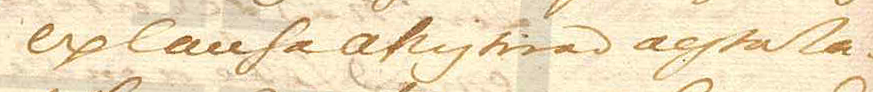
ex Causa assistiraõ a esta Ra
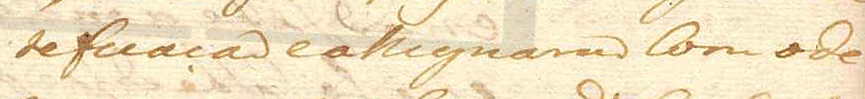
teficaçaõ e assignaraõ com o de
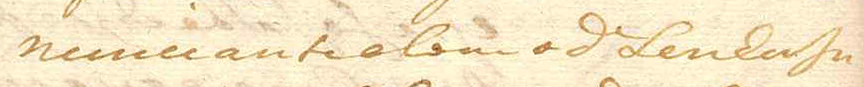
nunciante e com o do Senhor Jn
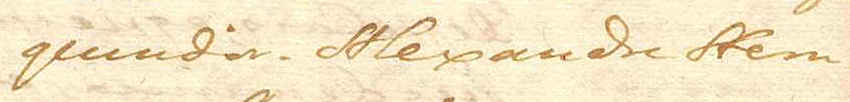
quizidor. Alexandre Hem
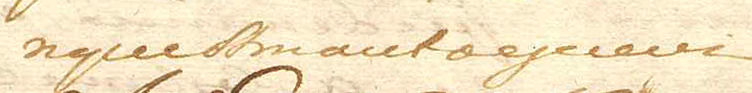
rique Arnaut o escrevi
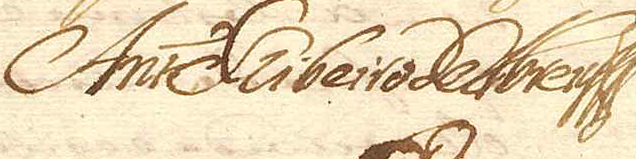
Anto Ribeiro de Abreu
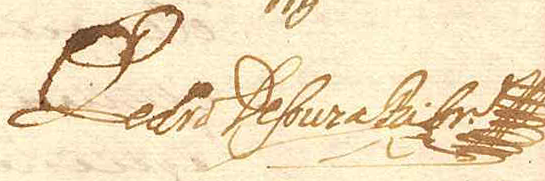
Pedro De souza Ribr.o
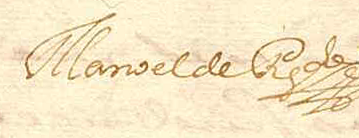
Manoel de Figdo
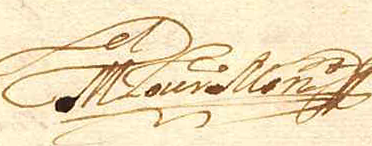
Mel Lourço Montro
